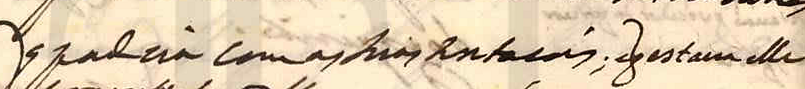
q̄ padecia com as suas tentaçois; e q̄ estaua elle
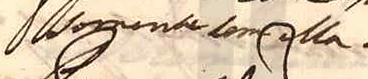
somente com ella.
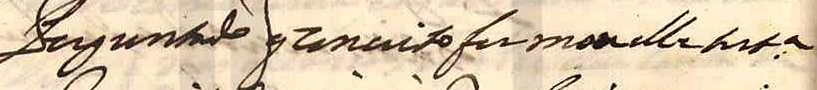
Perguntado q̄ conceito formou elle test.a
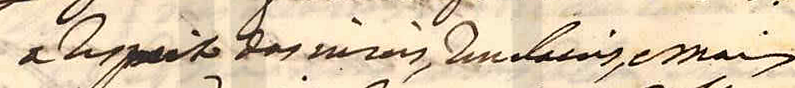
a Respeito das uizois, Reuelaçois, e mais
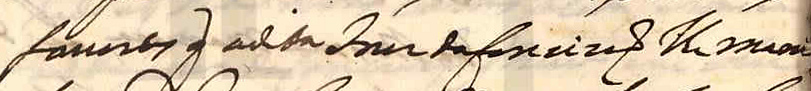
fauores q̄ a dita Ines da Conceiçaõ lhe mani
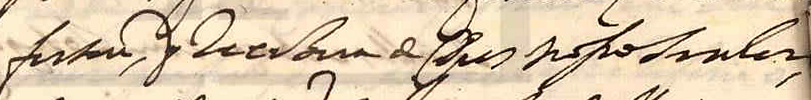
festou, q̄ Recebera de Deos nosso Senhor,
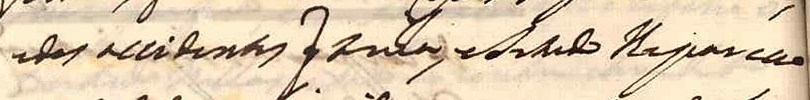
e dos accidentes q̄ tinha, e Se tudo lhe pareceo
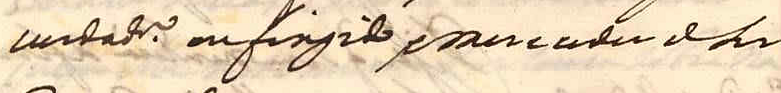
uerdadr.o ou fingido, e merecedor de ser
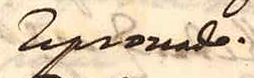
Reprouado.
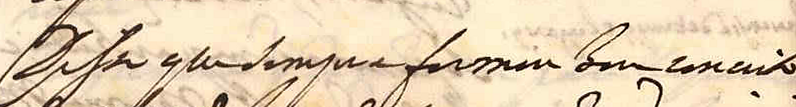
Disse que sempre formou bom conceito
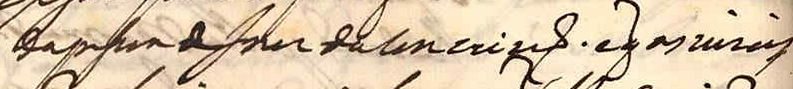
da pessoa de Jnes da conceiçaõ, e q̄ as uizois
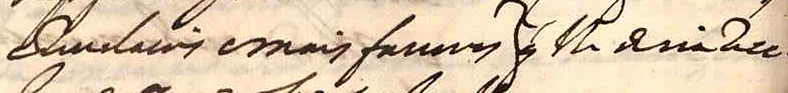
Reuelaçois, e mais fauores q̄ lhe dezia Rece
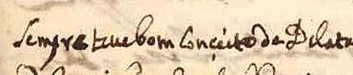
Sempre teue bom Conceito da Delata
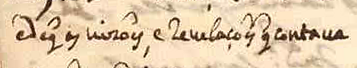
e de q̄ as uizões, e Reuelaçoẽs q̄ contaua
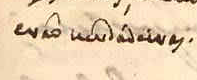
eraõ uerdadeiras.
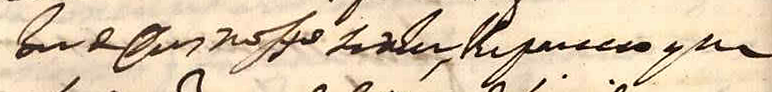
ber de Deos nosso senhor lhe pareceo que
